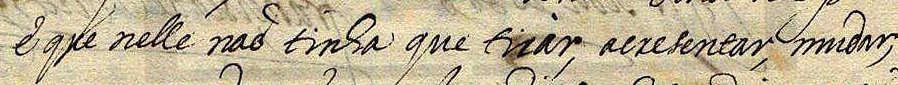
e que nelle naõ tinha que tirar, acresentar, mudar,
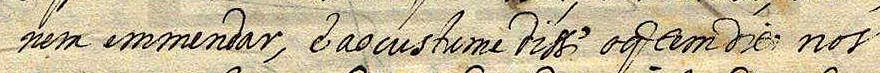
nem emmendar, e ao custume disse o q̄ tem dito nos
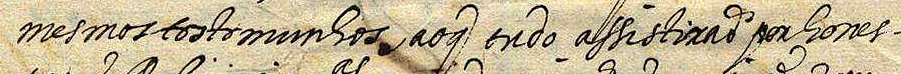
mesmos testemunhos, ao q̄ tudo assistiraõ por hones
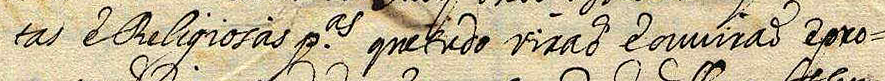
tas, e Religiosas p.as que tudo viraõ e ouuiraõ e pro
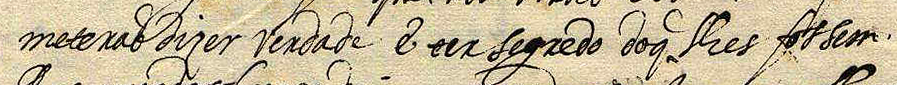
meteraõ dizer verdade e ter segredo do q̄ lhes fossem
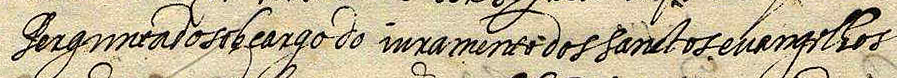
Perguntado sob cargo do iuramento dos sanctos euangelhos
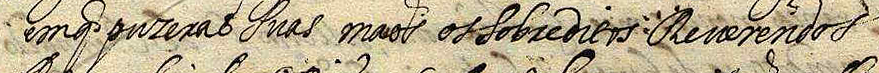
em q̄ puzeraõ suas maõs os sobreditos Reuerendos
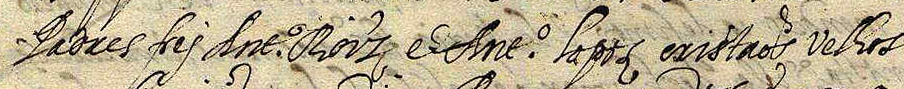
Padres frej Ant.o Roīz e Ant.o lopez cristaõs velhos
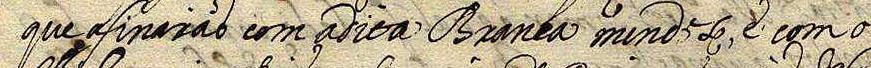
que asinaraõ com a dita Branca mendez, e com o
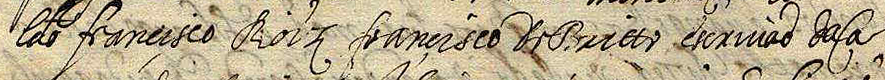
ldo francisco Roīz francisco de Britto escriuaõ da Ca
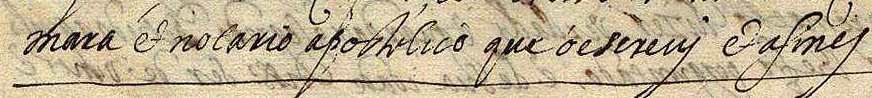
mara & notario apostolico que o escreuj & asinej
